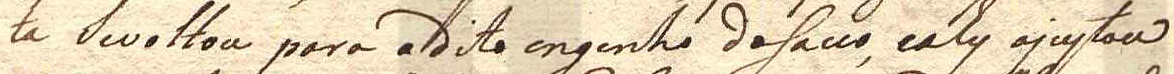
ta Se voltou para o dito engenho do sacco, e ahy ajustou
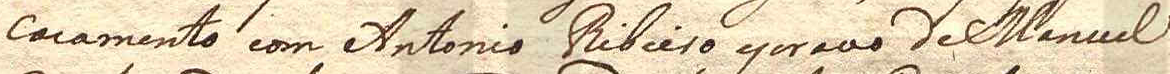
cazamento com Antonio Ribeiro escravo de Manuel
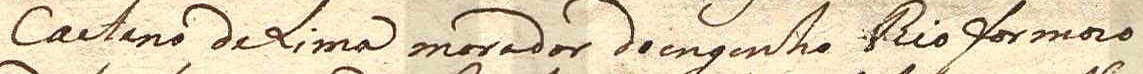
Caetano de Lima morador do engenho Rio formozo
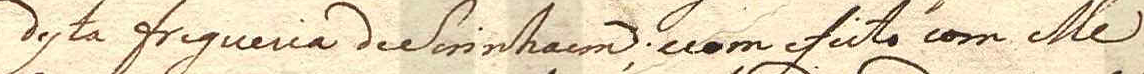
desta freguezia de Serinhaem; e com efeito com elle
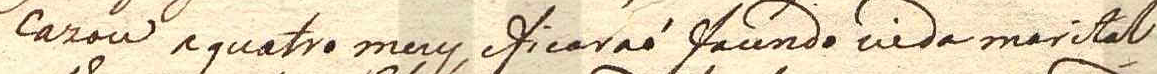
cazou a quatro mezes, e ficaraõ fazendo vida marital
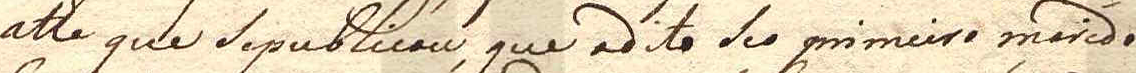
athe que sepublicou, que o dito seo primeiro marido
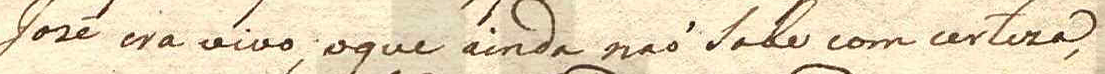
Jozé era vivo, o que ainda naõ sabe com certeza,
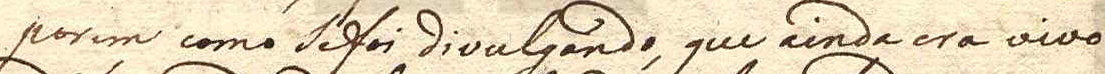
porem como se foi divulgando, que ainda era vivo
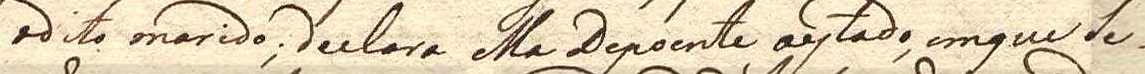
o dito marido; declara ella Depoente o estado, em que se
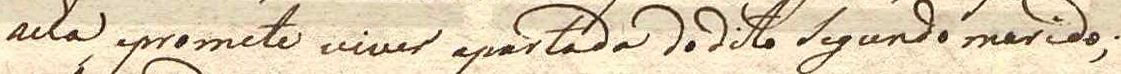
acha, e promete viver apartada do dito segundo marido;
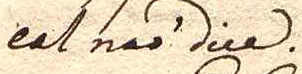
e al naõ dice.
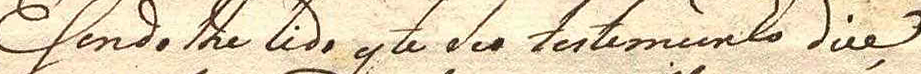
E sendo lhe lido este seo testemunho dice,
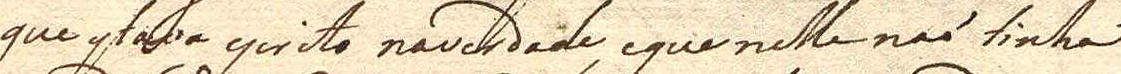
que estava escrito na verdade, e que nelle naõ tinha
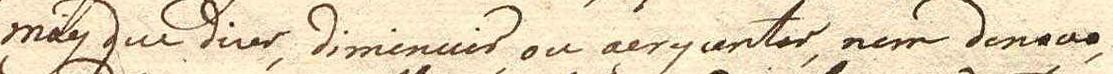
mais que dizer, diminuir, ou acrescentar, nem de novo,
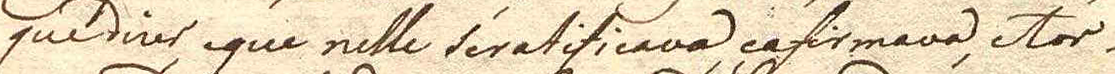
que dizer, e que nelle se ratificava, e afirmava, e tor
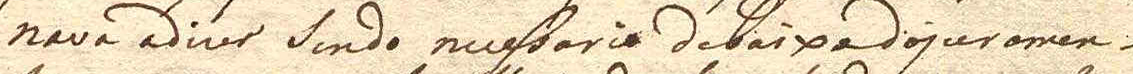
nava a dizer sendo necessario debaixo do juramen
